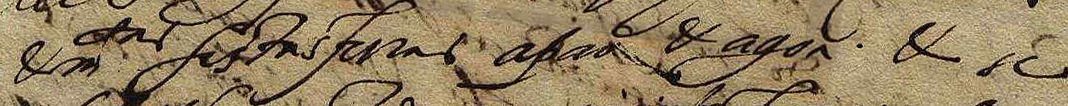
& mtas sestas feiras a paõ & agoa. & se
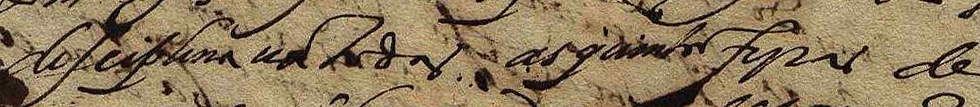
disciplinaua todas as quintas fejras de
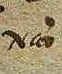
Não
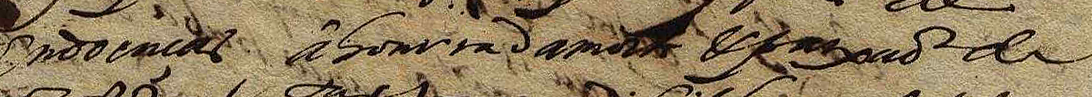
Endoenças à honrra da morte & paixaõ de
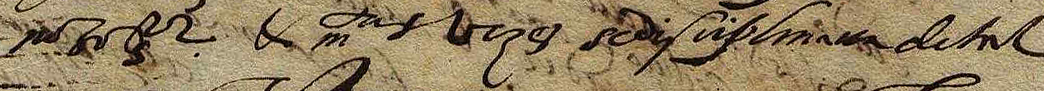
noso sor. & mtas vezes se disciplinaua de tal
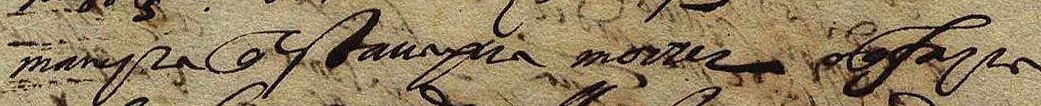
manejra q̄ estaua pera morrer o q̄ fazia
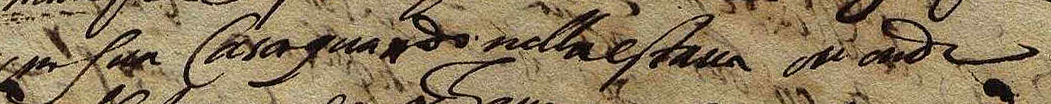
em sua Casa quando nella estaua ou onde
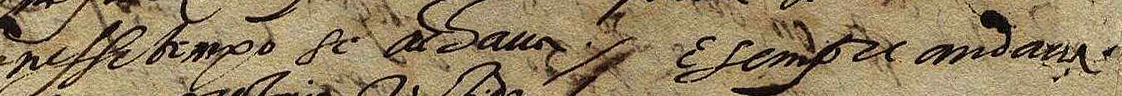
nesse tempo se achaua ./ E sempre andaua
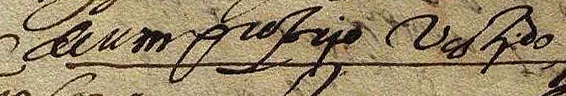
de um proprjo vestjdo
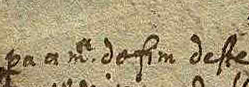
ꝑa a ma. do fim deste
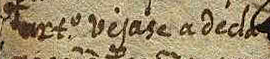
art.o vejase a decla
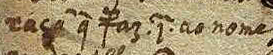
raçā q̄ faz .j̄. ao nome
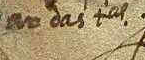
ar das tas.
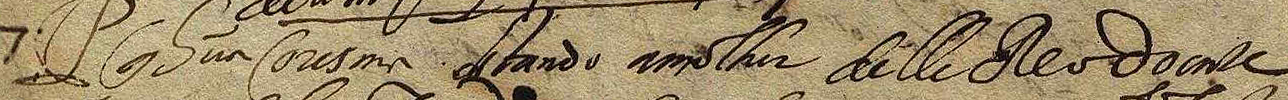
P q̄ hūa Coresma estando a molher delle Reo doente
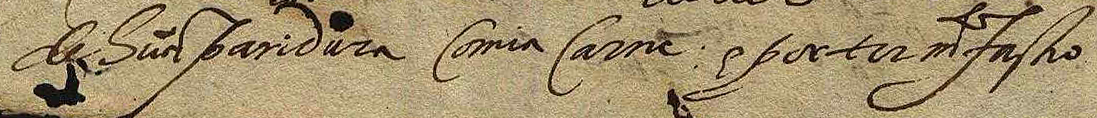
de huã paridura Comia Carne : E por ter mto fastio
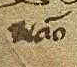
Não
